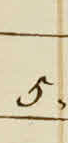5
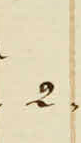2
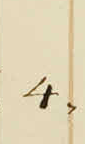4
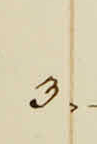3
